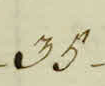35
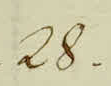28
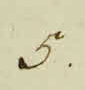5
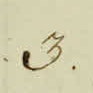3
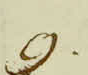9
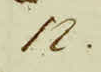12
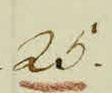25
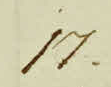17
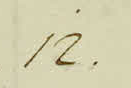12.
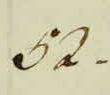52
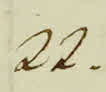22
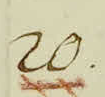20
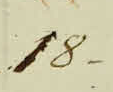18
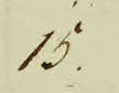15
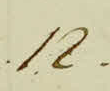12
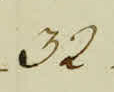32
